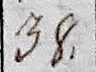38
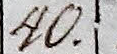40.
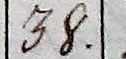38.
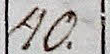40.
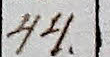44.
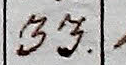33.
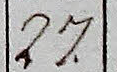27.
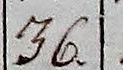36.
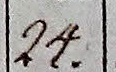24.
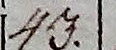43.
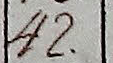42.
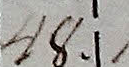48.
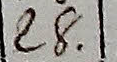28.
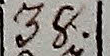38
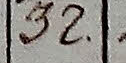32
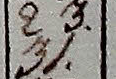31.
